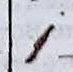1
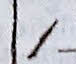1
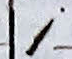1
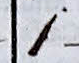1
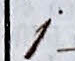1
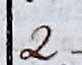2
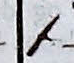1
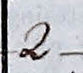2
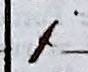1
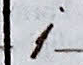1
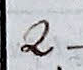2
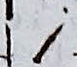1
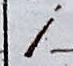1
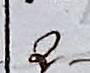2
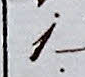1
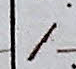1
